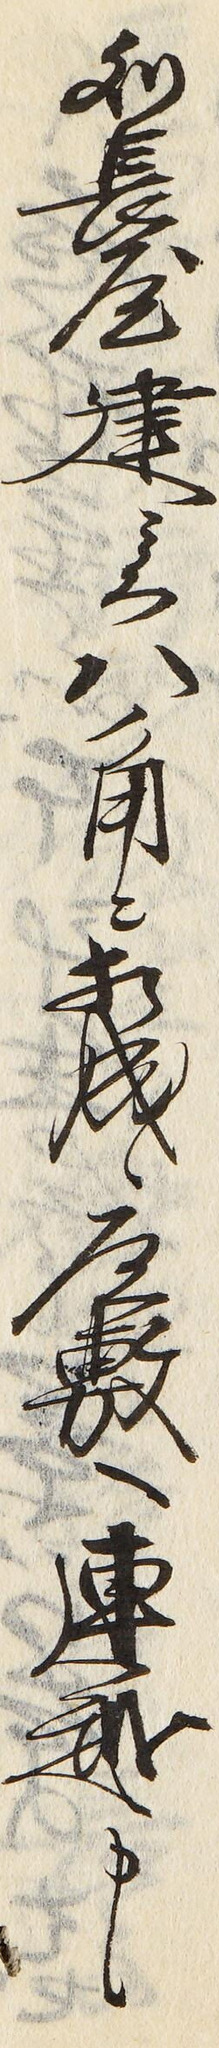処長屋建ニ而八角ニ相成候屋敷へ連越申候
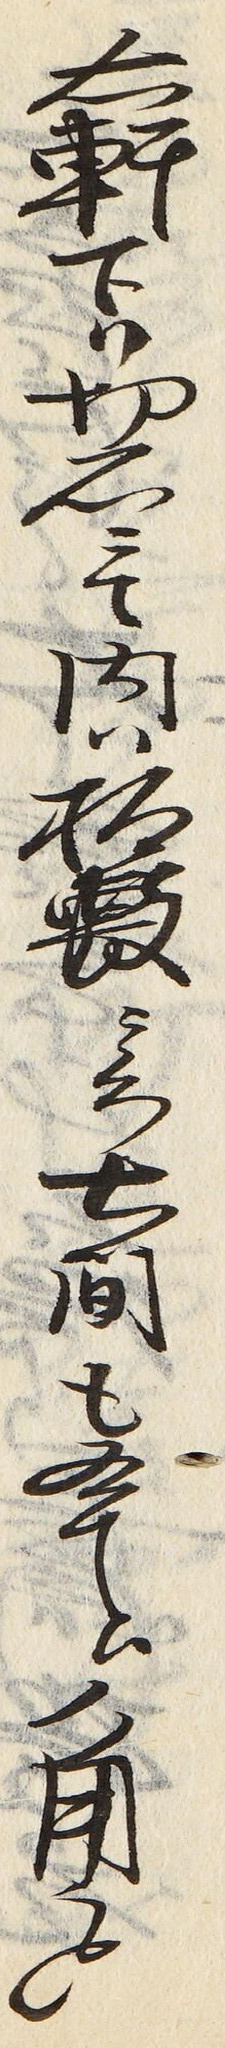右軒下は切石ニて内は板敷ニ而七間も有之候角も
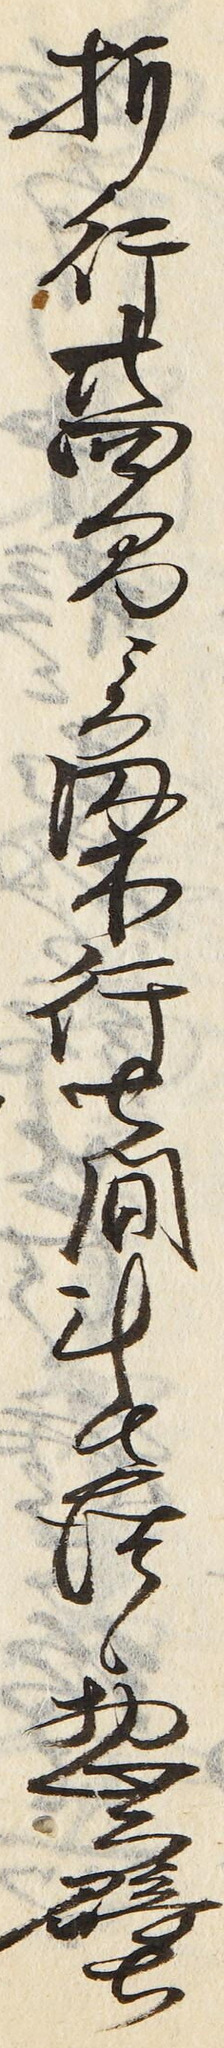桁行廿四間ニ而梁行七間計御座候惣而壁
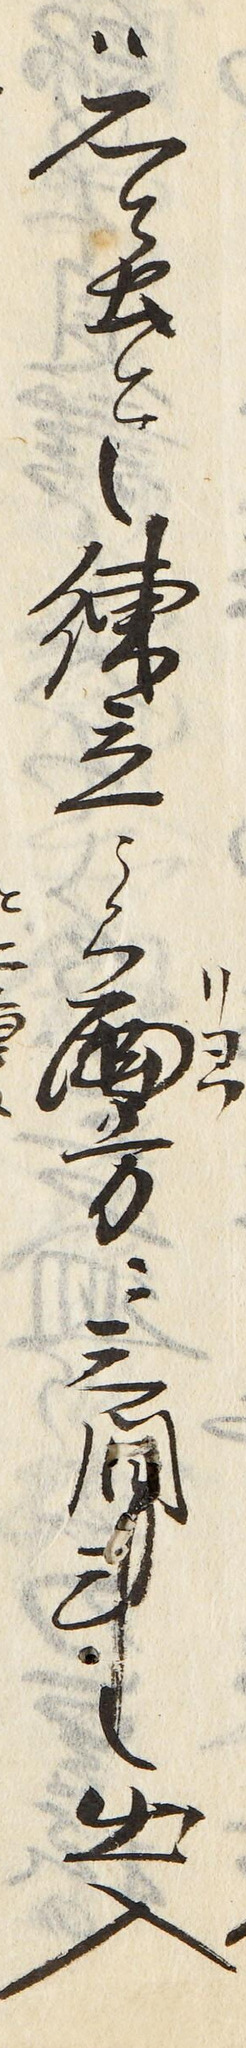は石と土と之練立ニ而両方に三間計之出入
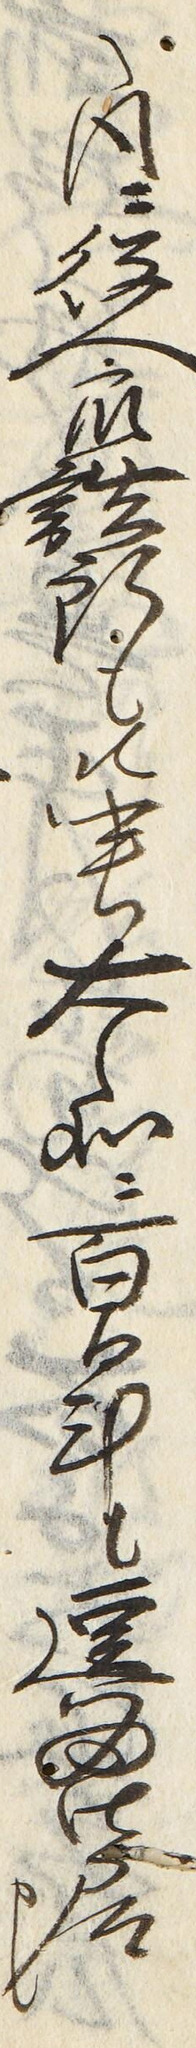之内ニ役人衆詰所も御座候右之処ニ百日計も逗留仕居申候
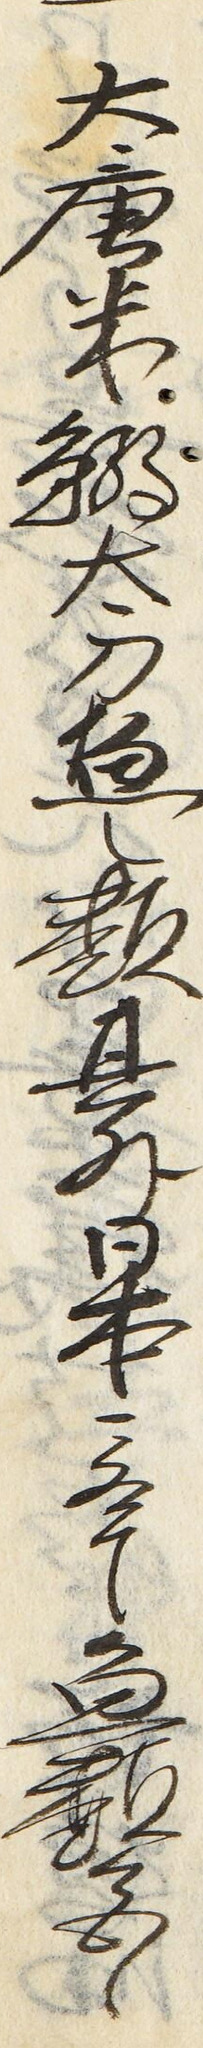一大唐米鰯太刀魚之類其外日本ニ有候魚類色々

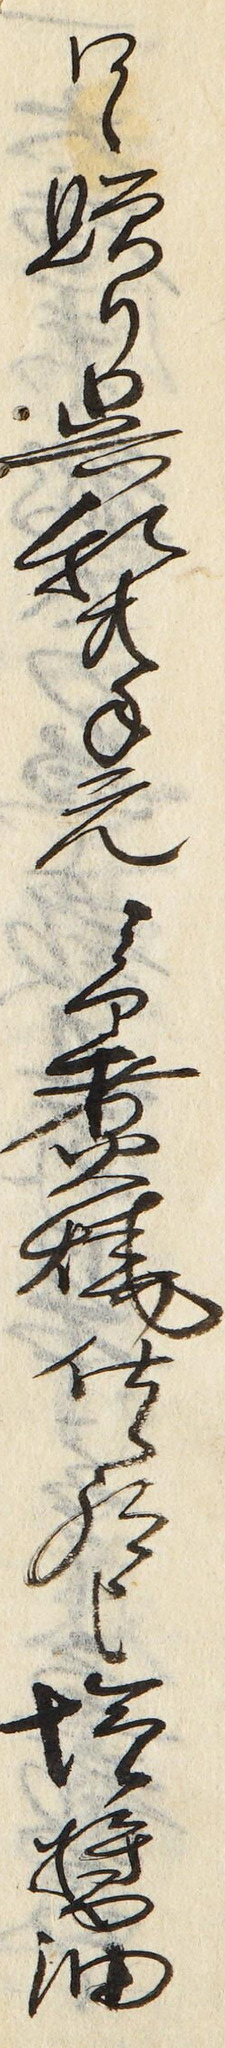口々贈り呉私共手元ニ而煮焼仕候給申候塩醬油
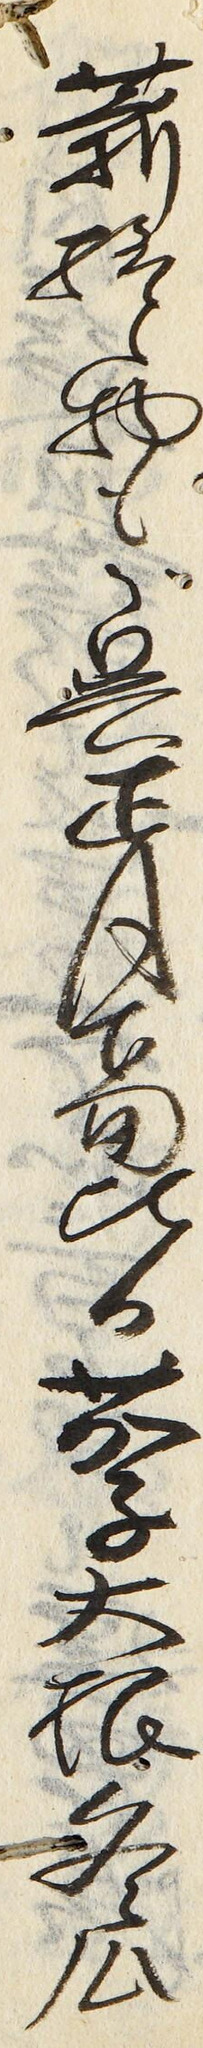薪様之物も被呉正月下旬頃日茄子大根冬瓜
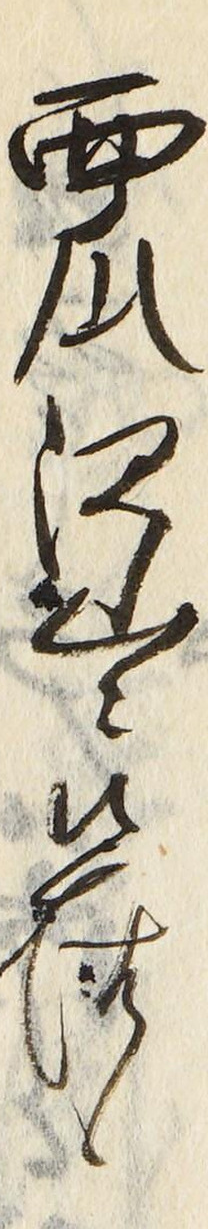西瓜沢山ニ御座候
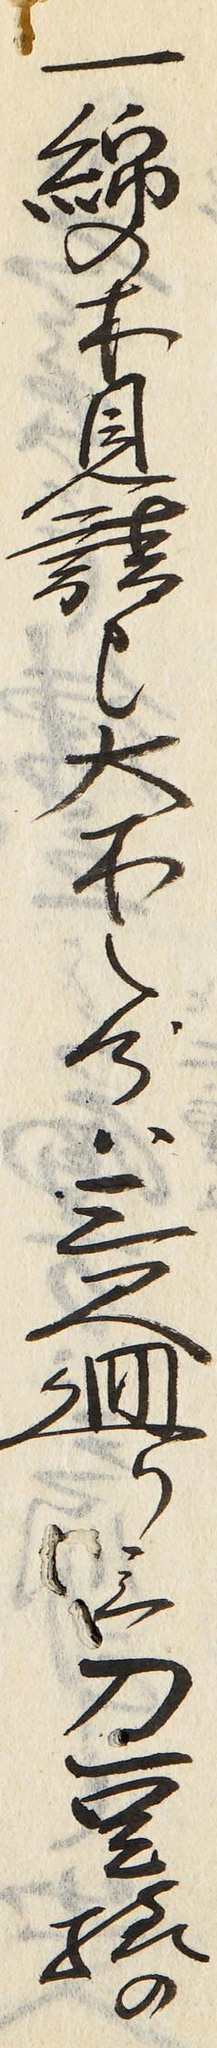一綿の木見請申候大木之分は三尺廻り之刀豆様の
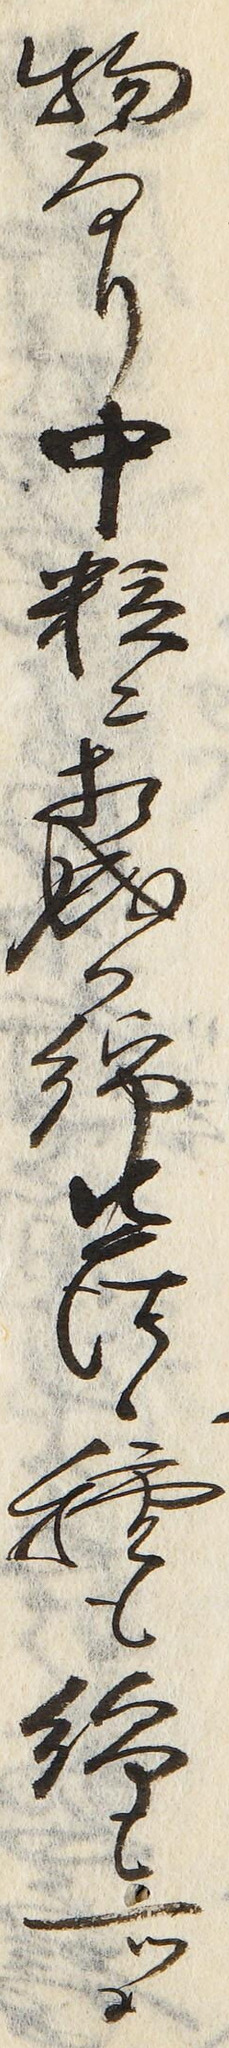物なり中粒ニ相成り綿御座候種も綿も一ッに
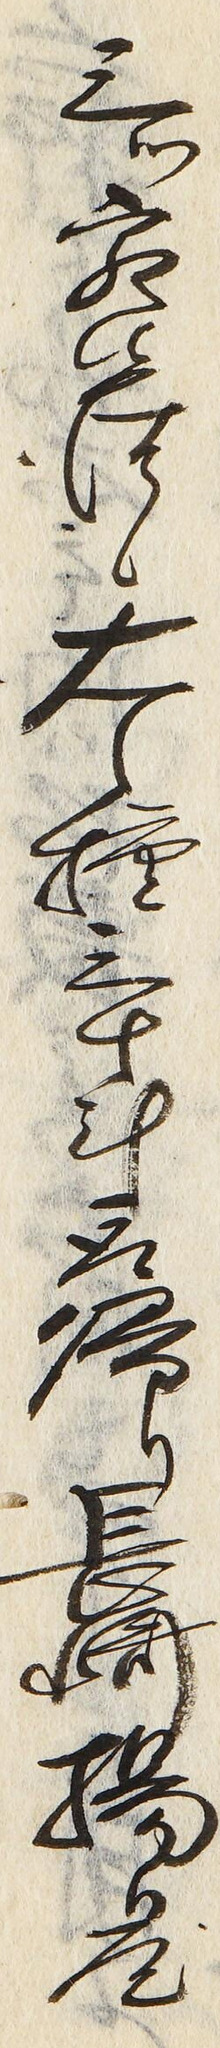三ッ宛御座候右の種三十計取帰り長崎揚り屋
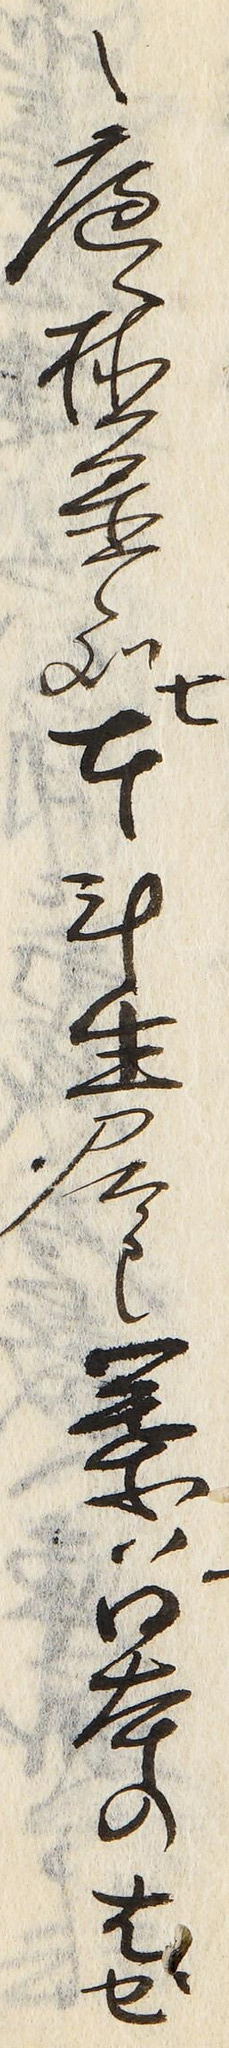之庭へ植置候処七本計生居申候葉は日本のはせ
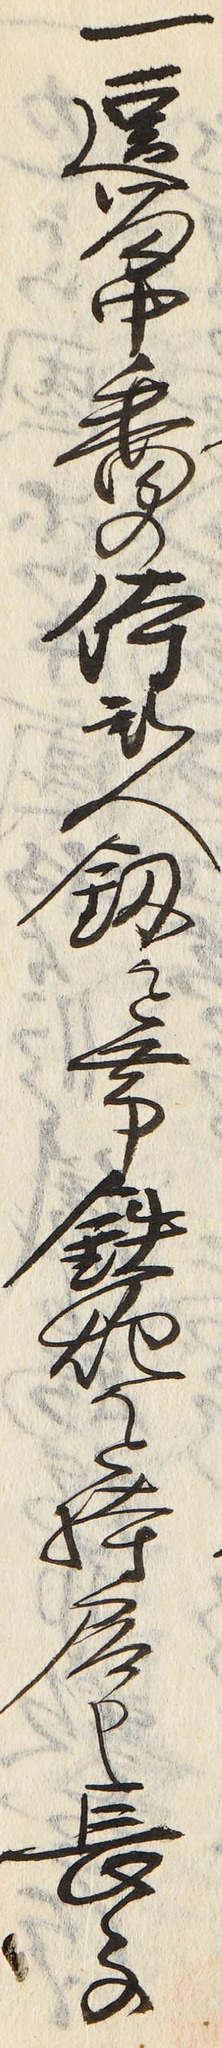一逗留中番の侍弐人釼を帯鉄砲を持居申候長々の
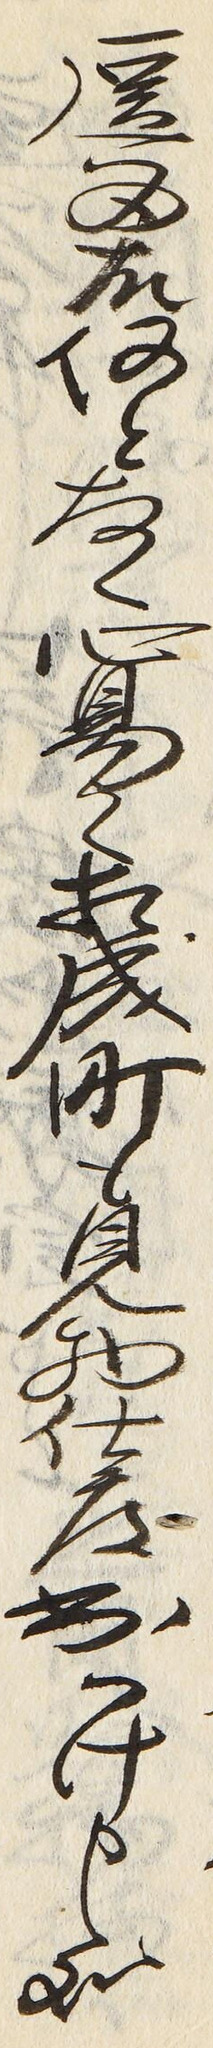逗留故何となく心易く相成町も見物仕度書つけ申候処
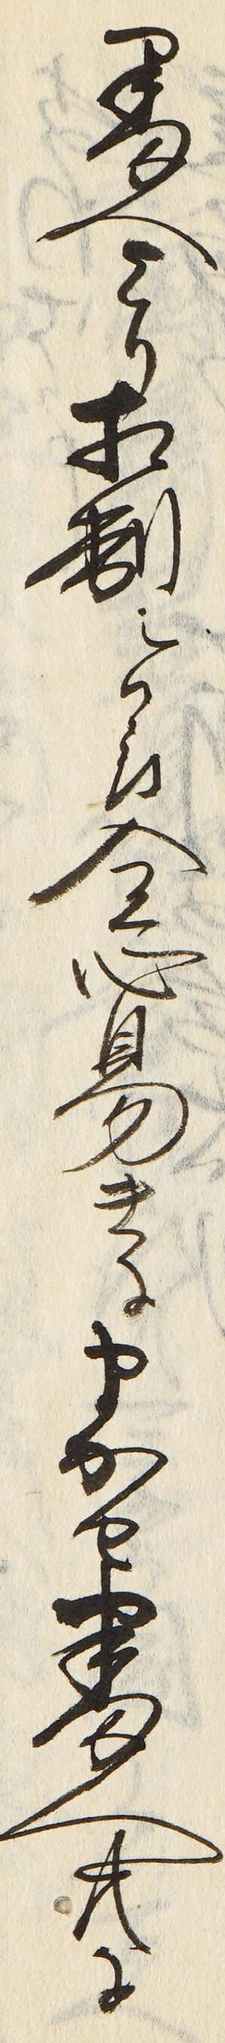番人より相制シ候て全心易きにまかせ番人共に
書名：漂流記
